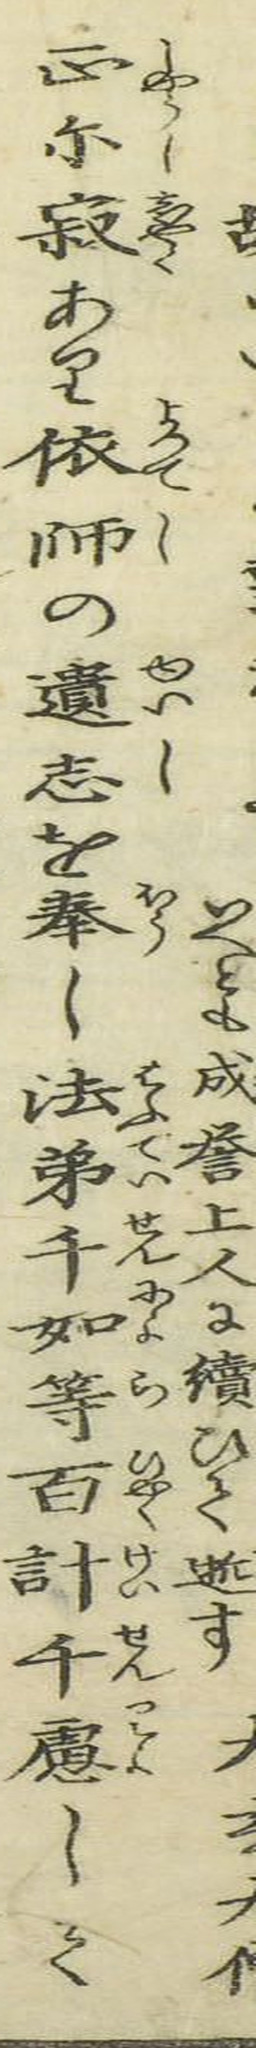正尓寂あり依師の遺志を奉し法弟千如等百計千慮して
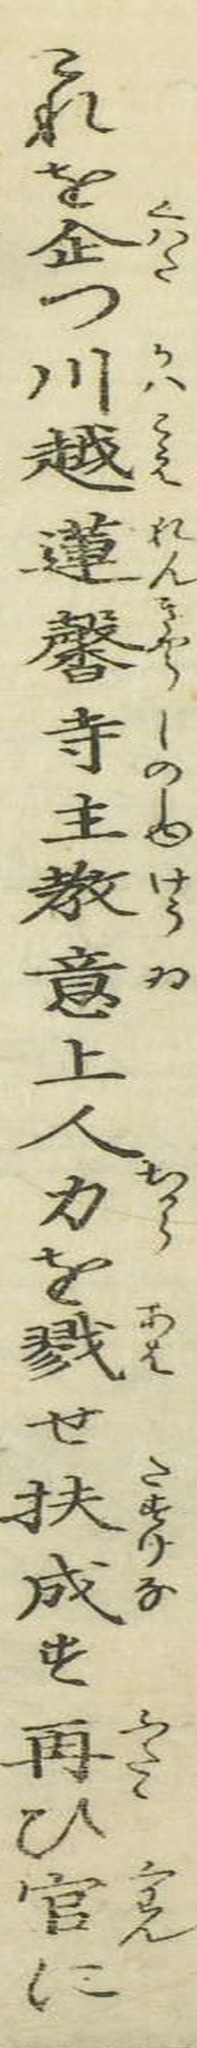これを企つ川越蓮馨寺主教意上人力を戮せ扶成す再ひ官に
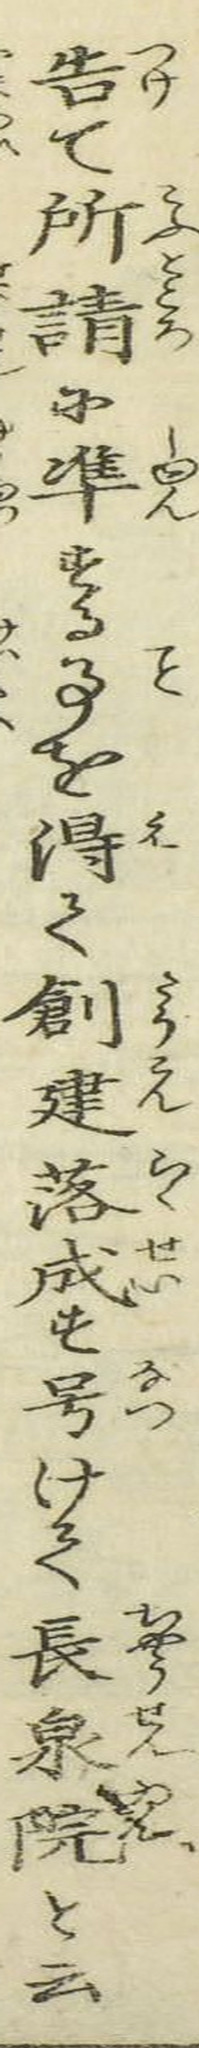告て所請に準する事を得て創建落成す号けて長泉院と云
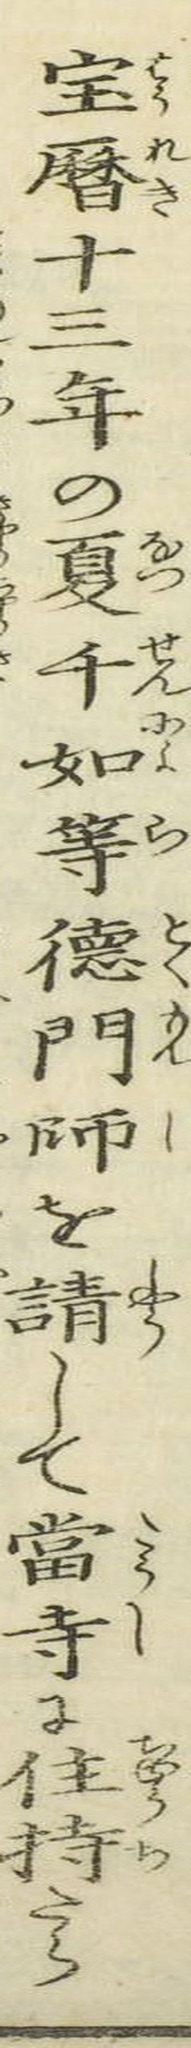宝暦十三年の夏千如等德門師を請して當寺に住持たら
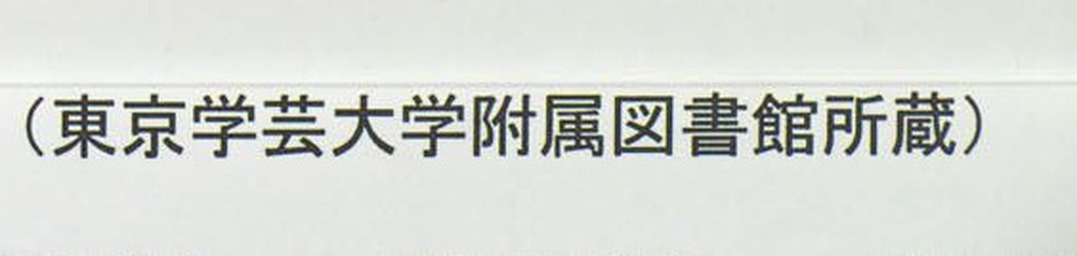東京学芸大学附属図書館
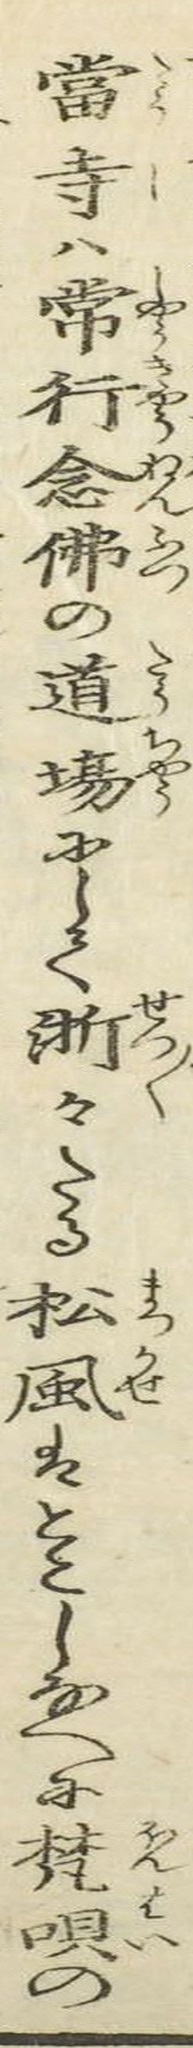當寺は常行念佛の道塲にして浙々たる松風はとこしなへに梵唄の
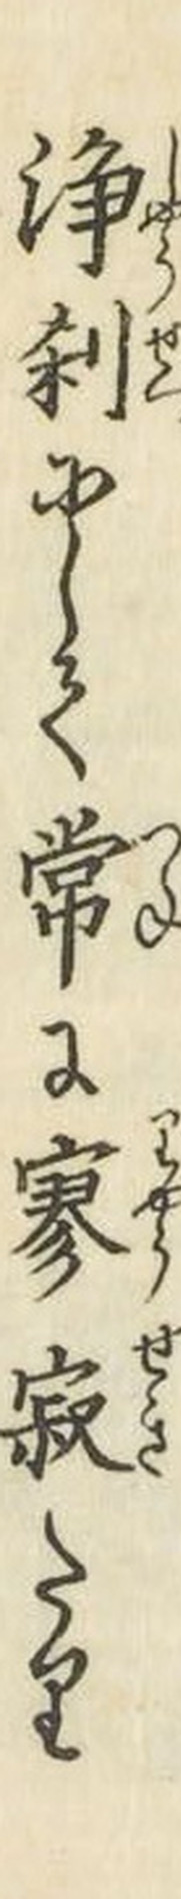浄刹にして常に寥寂たり
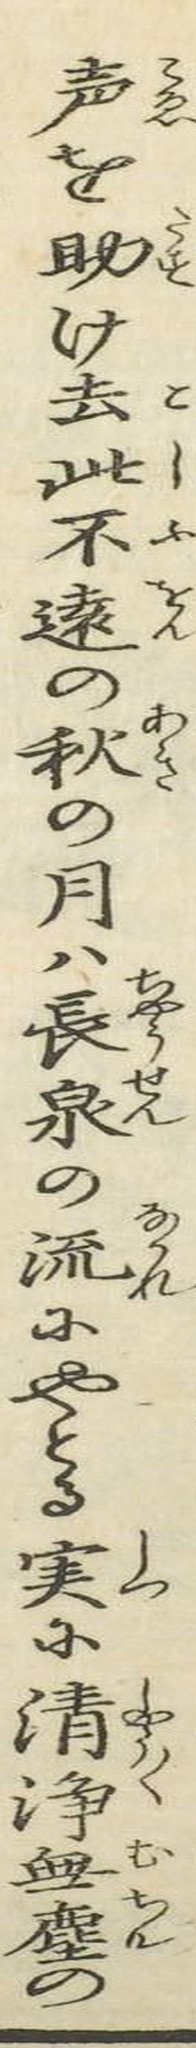声を助け去此不遠の秋の月は長泉の流にやとる実に清浄無塵の
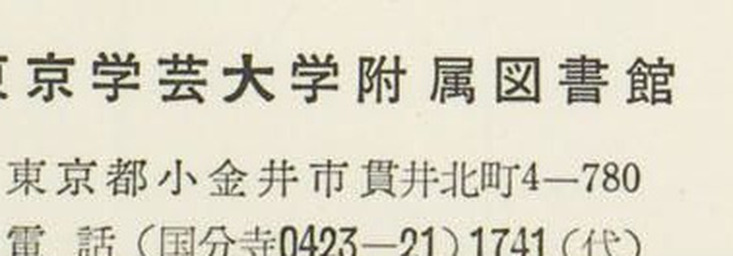東京学芸大学附属図書館
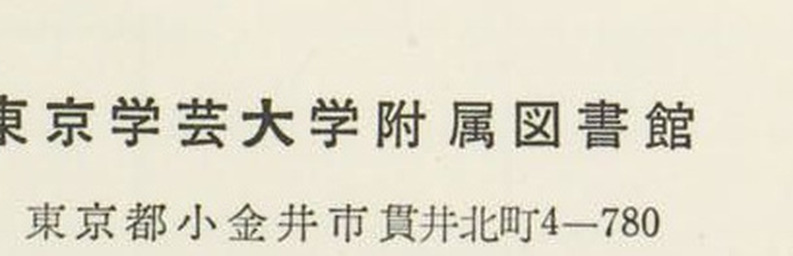東京学芸大学附属図書館
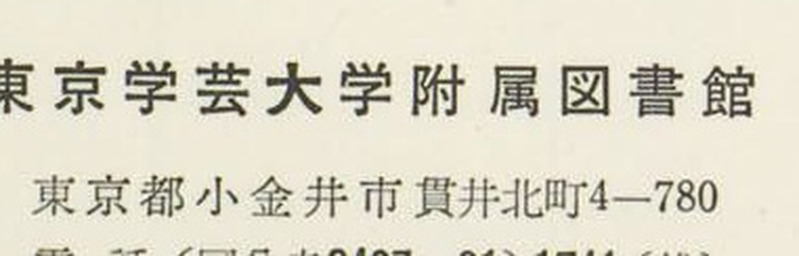東京学芸大学附属図書館
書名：江戸名所図会 20巻 巻之7
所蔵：東京学芸大学教育コンテンツアーカイブ
